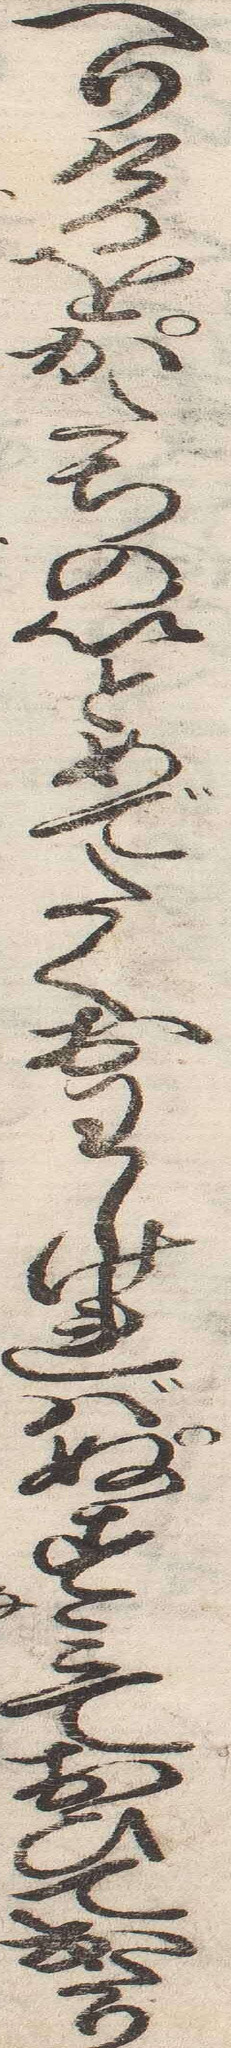へりけるを。かたちのいとめでたくおわしければ。ぬすみておひて出たり
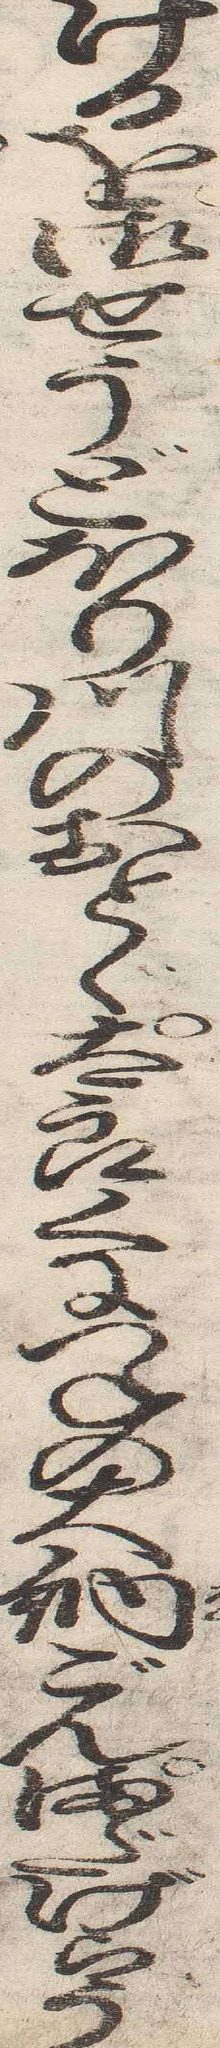けるを。御せうどほり川のおとゞ。太郎くにつねの大納ごん。まだげらう
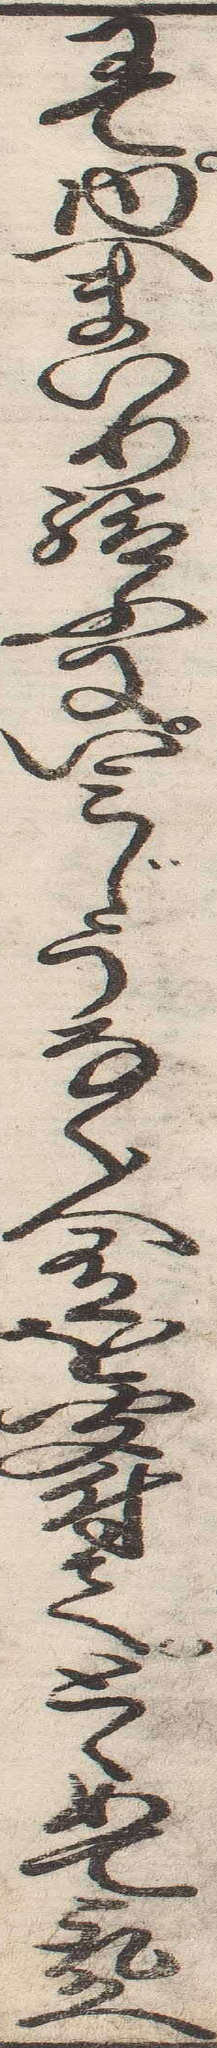にて。内へまいり給に。いみじうなく人有を聞付て。とゝめて取かへ
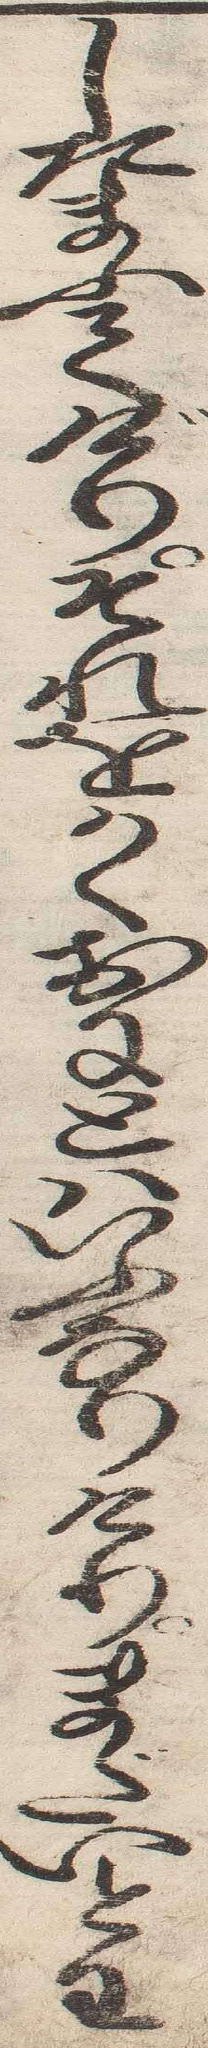したまふてげり。それをかくおにとはいふなりけり。まだいとわ
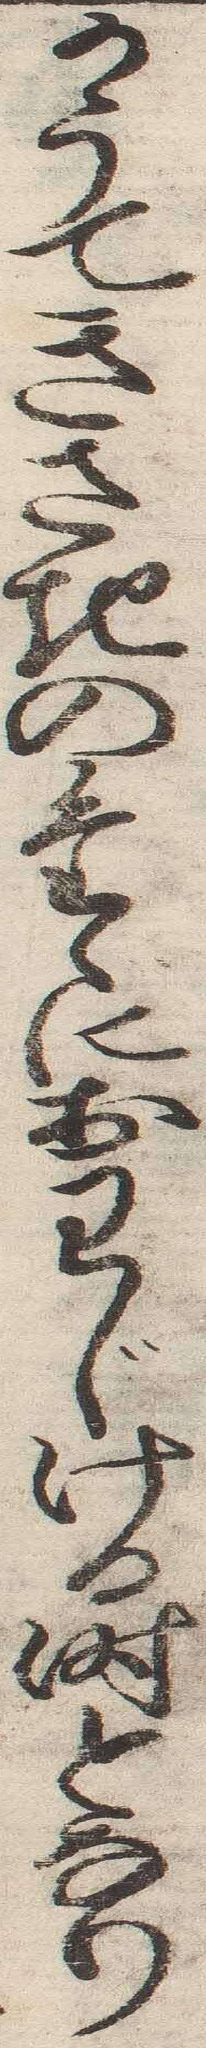かうてきさきのたゝにおわじける時となり
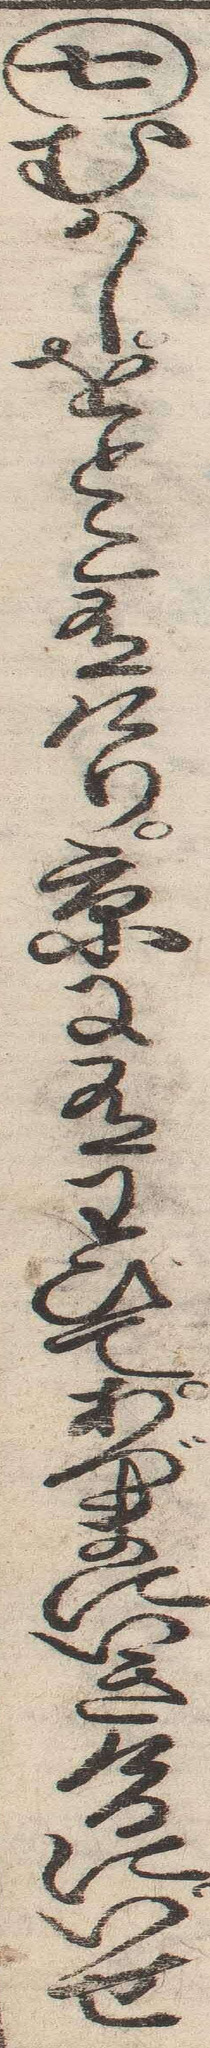㊆むかし。をとこ有けり。京に有わひて。あづまにいきけるに。いせ

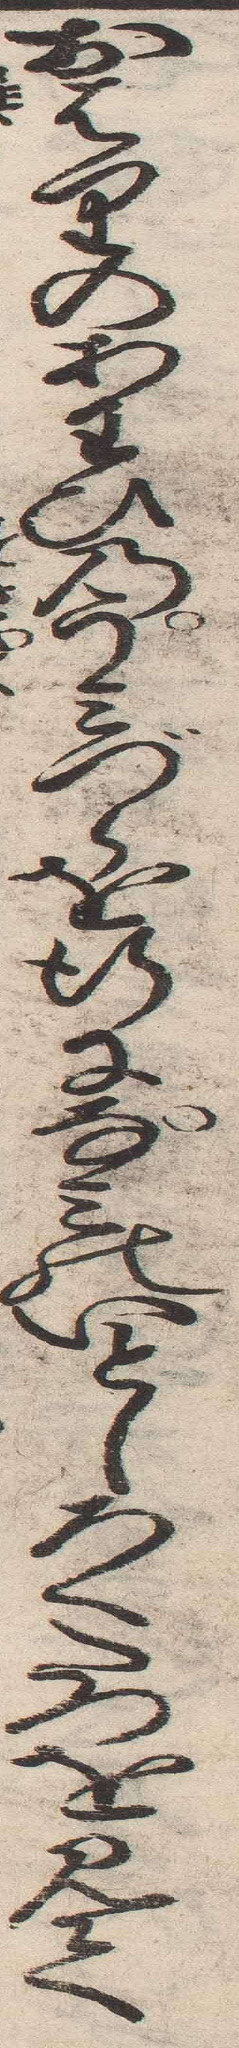おはりのあわひの。うみづらを行に。なみのいとしろくたつを見て
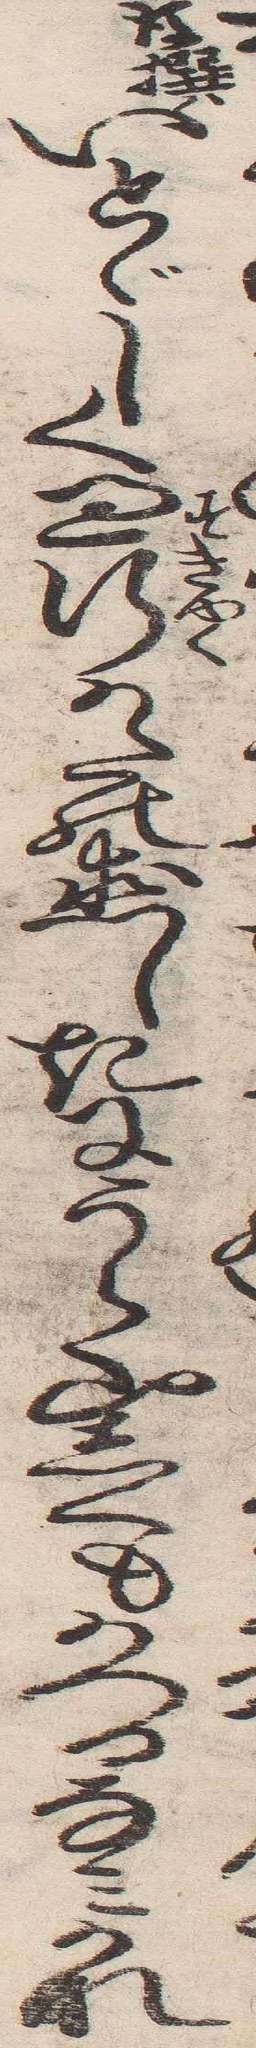後撰いとゞしく過行かたの恋しきにうら山しくもかへるなみかな
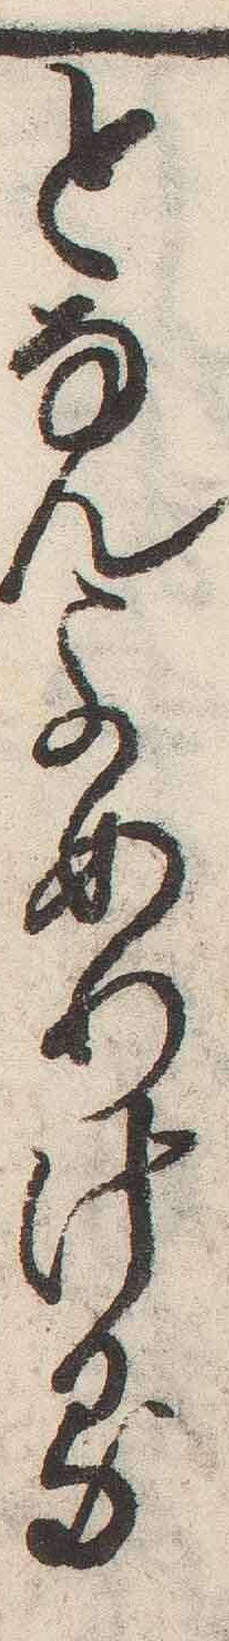となんよめりける
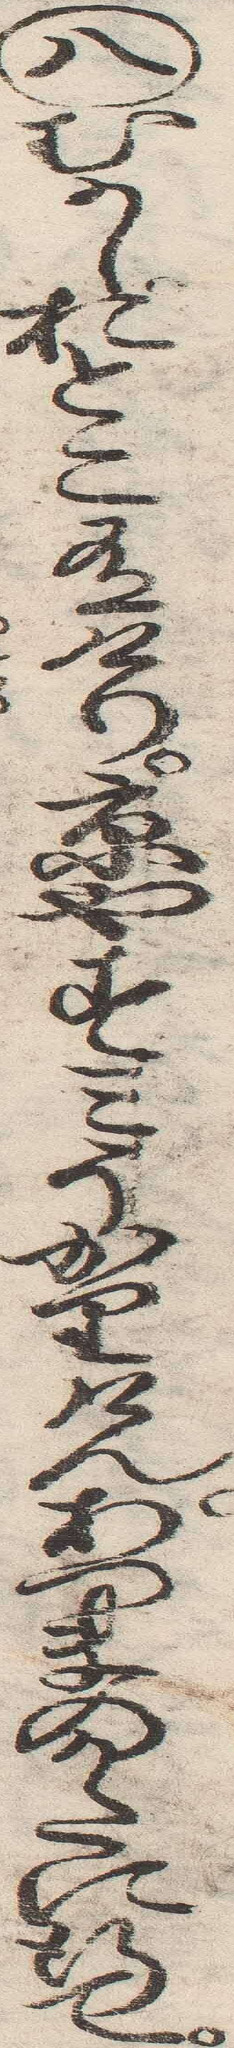㊇むかし。おとこ有けり。京やすみうかりけん。あつまのかたに行て。
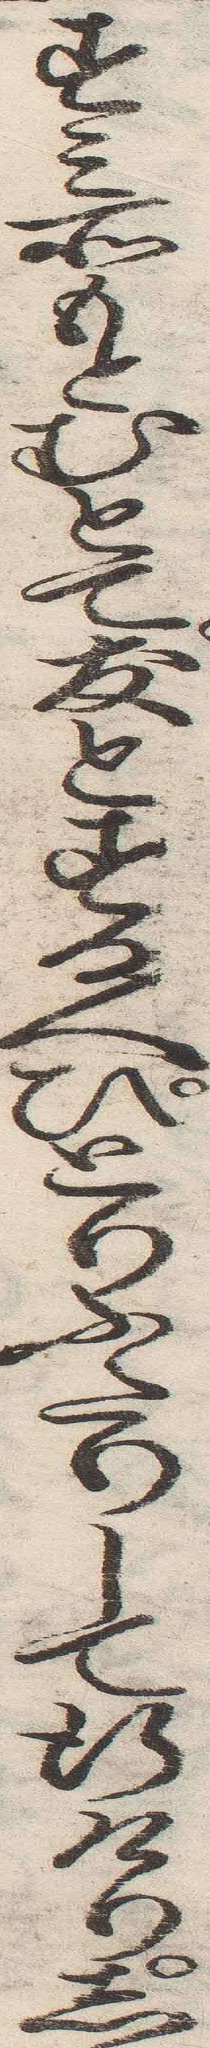すみ所もとむとて。友とする人。ひとりふたりして行けり。し
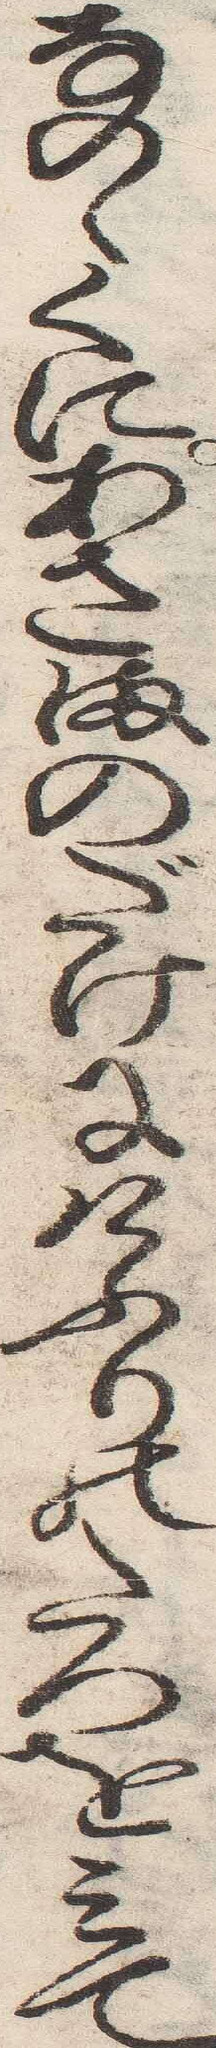なのゝくに。あさまのだけにけふりのたつをみて
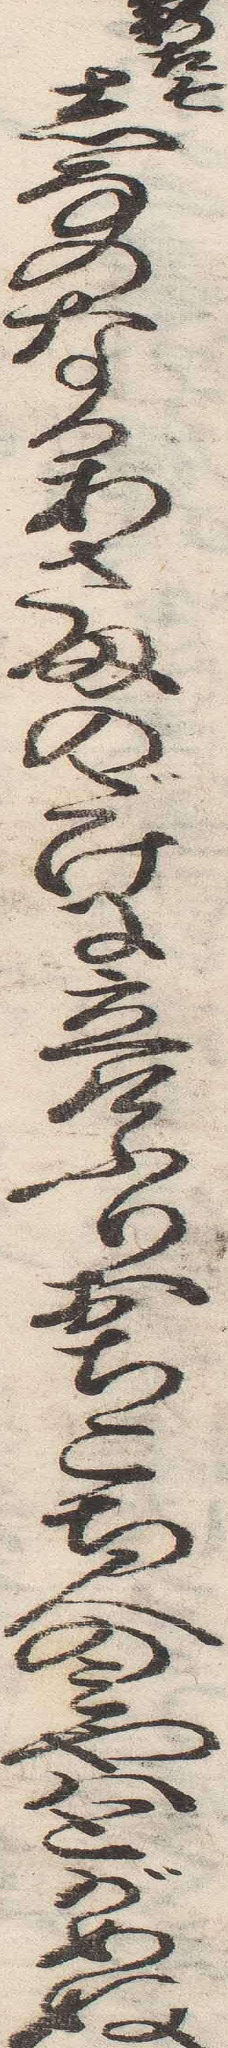新古今しなのなるあさまのだけに立けふりおちこち人のみやはとがめぬ
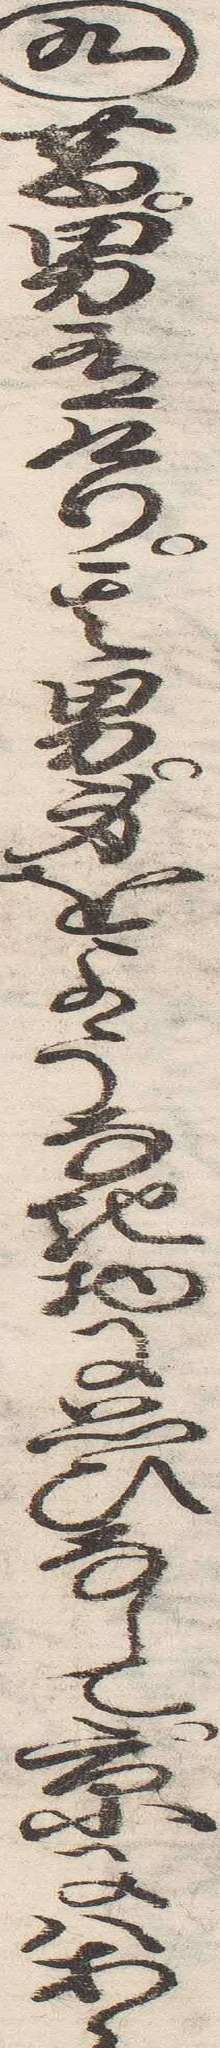㊈昔。男有けり。其男。身をようなき物に思ひなして。京にはあら
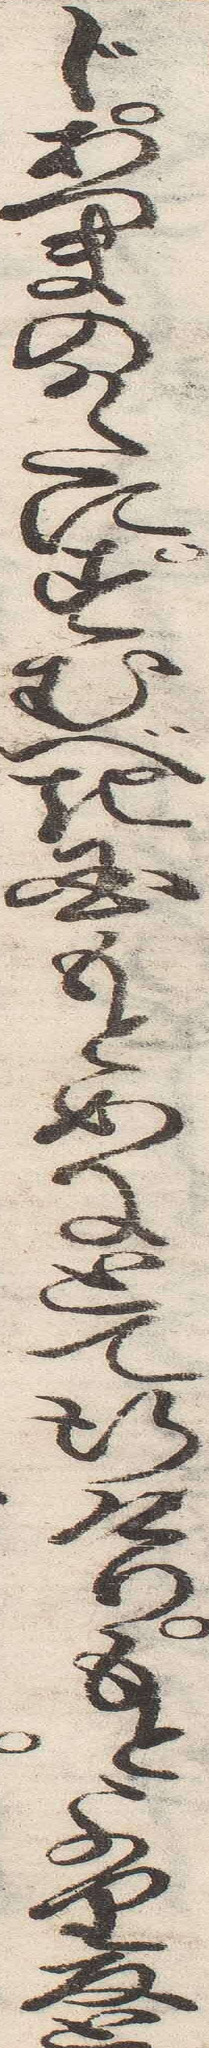じ。あつまのかたに。すむべき国もとめにとて行けり。もとより友と
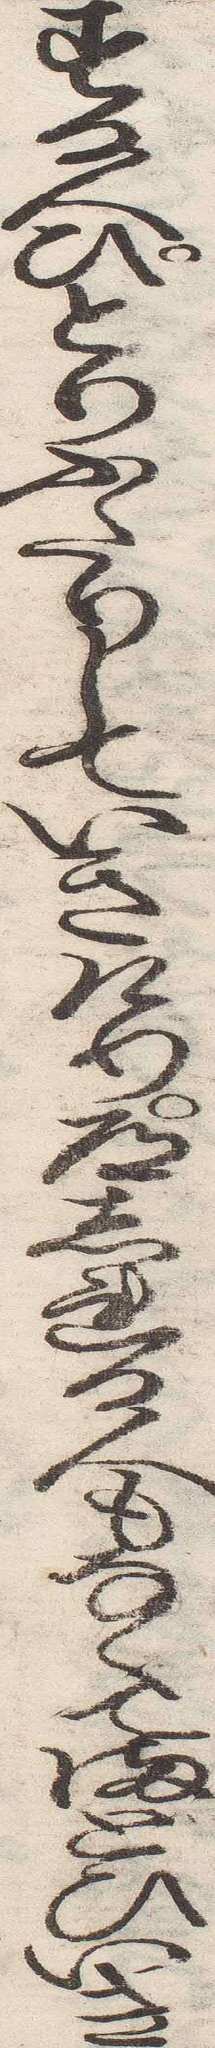する人。ひとりふたりしていきけり。道しれる人もなくて。まとひいき
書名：伊勢物語
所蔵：東京学芸大学附属図書館 国文学研究資料館
